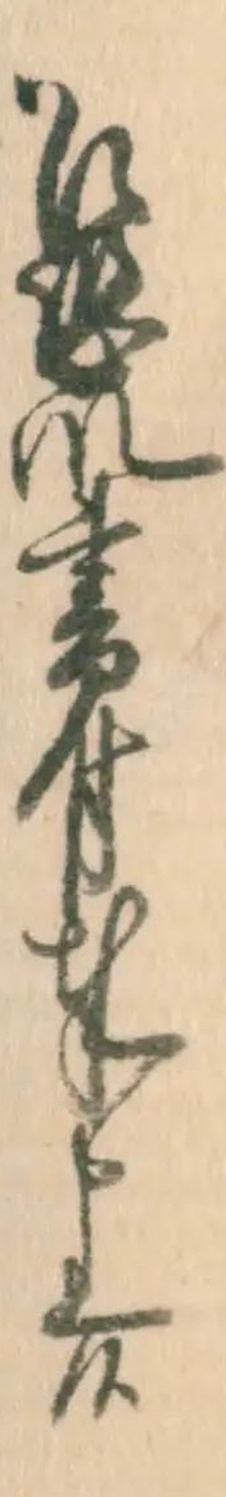乍恐以書付奉申上候
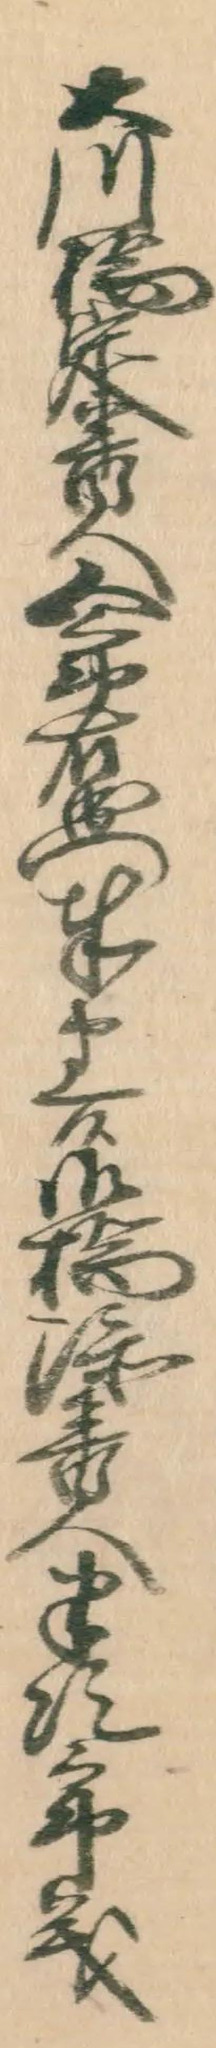一大川橋定番人五郎右衛門奉申上候御橋添番人半次郎義
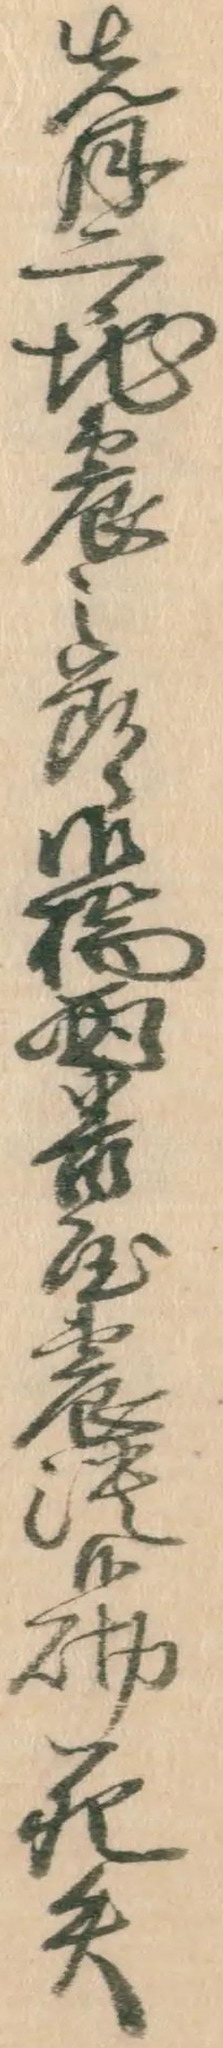先月二日地震之節御橋西番屋震潰候砌死失
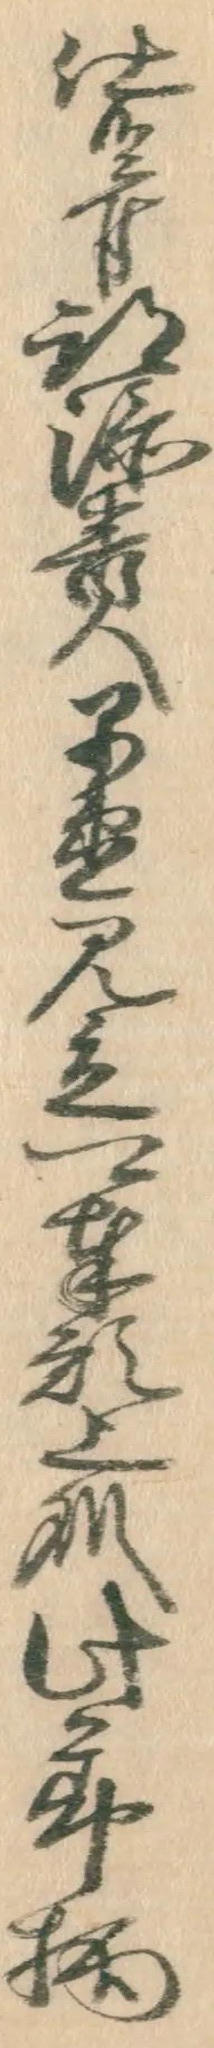仕候ニ付跡添番人早速見立可奉願上処此節柄
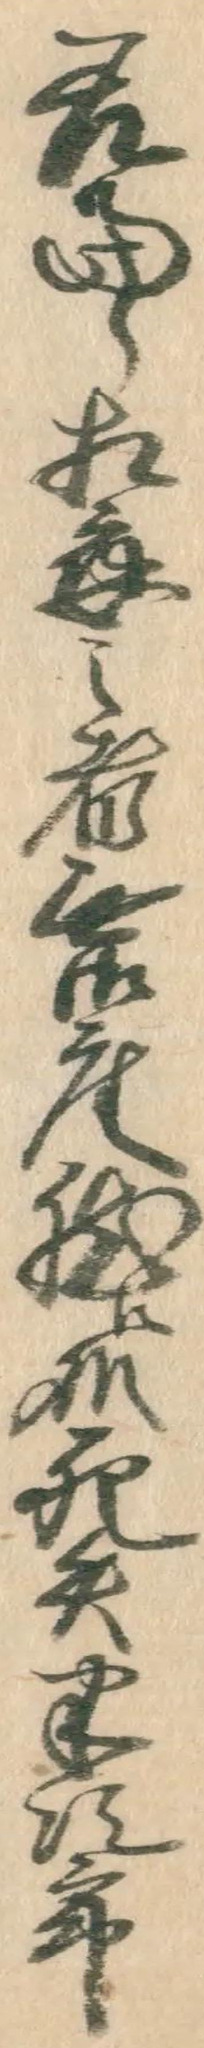差当り相応之者無御座然ル処死失半次郎
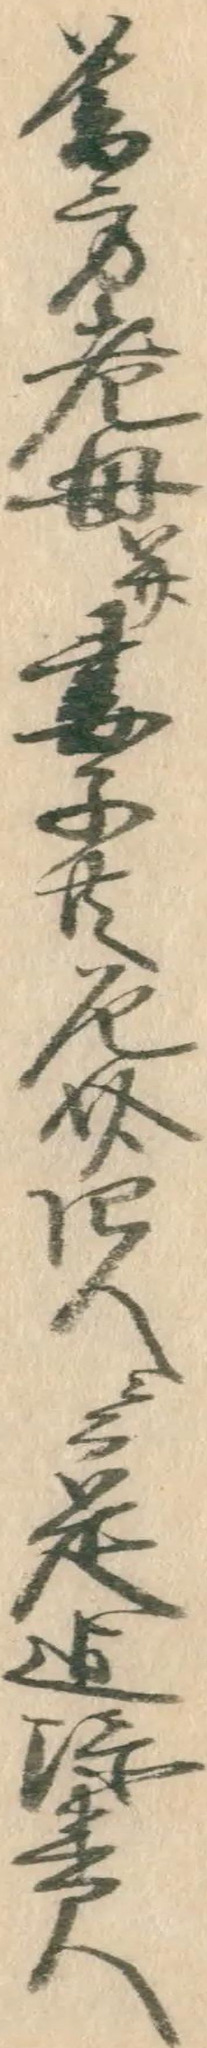暮方老母并妻子共厄介四人ニ而是迄添番人
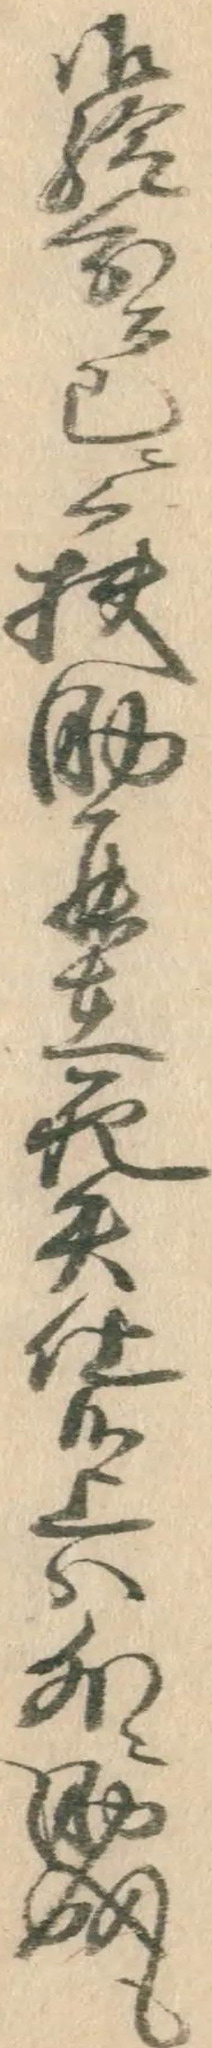御給分而已ニ而扶助罷在死失仕候上ハ外ニ助成も
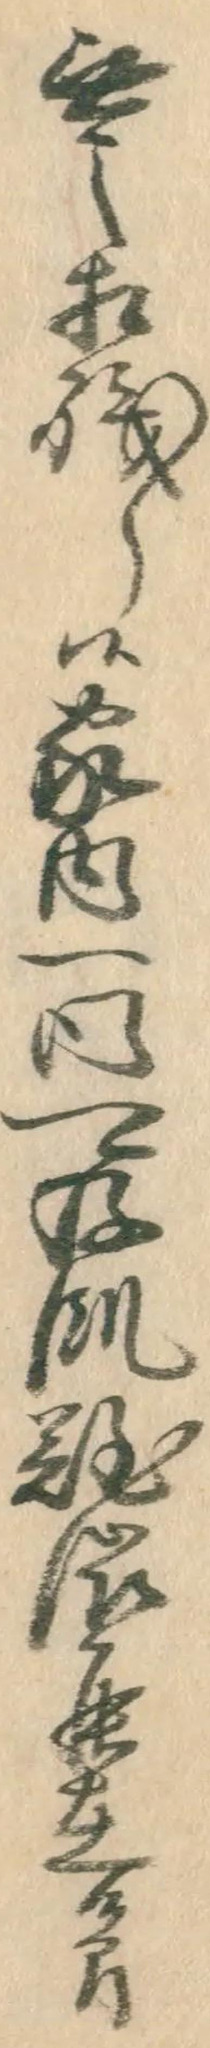無之相残り候家内一同可及飢難渋罷在候間

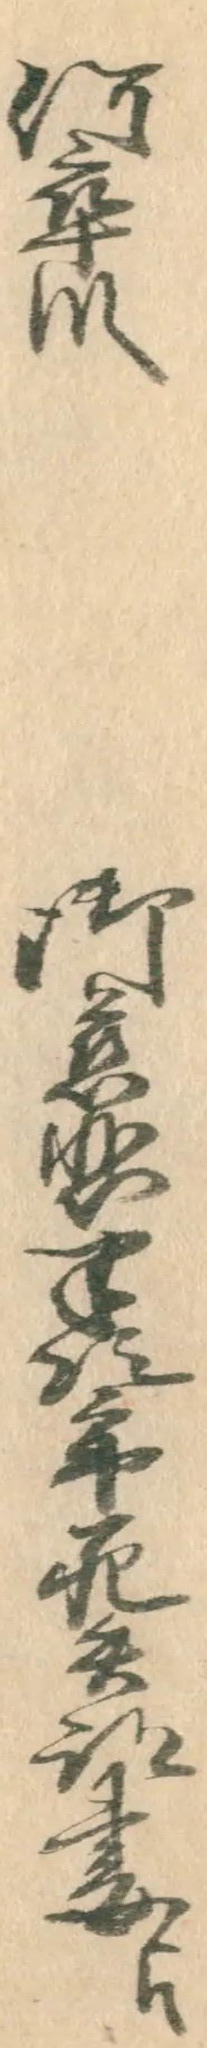何卒以御慈悲半次郎死失跡妻え
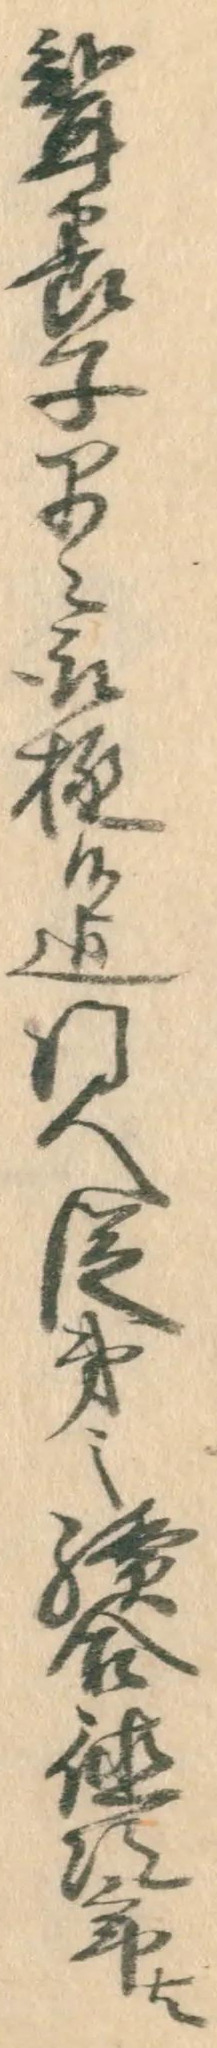聟養子早々取極候迄同人従弟之続合徳次郎と
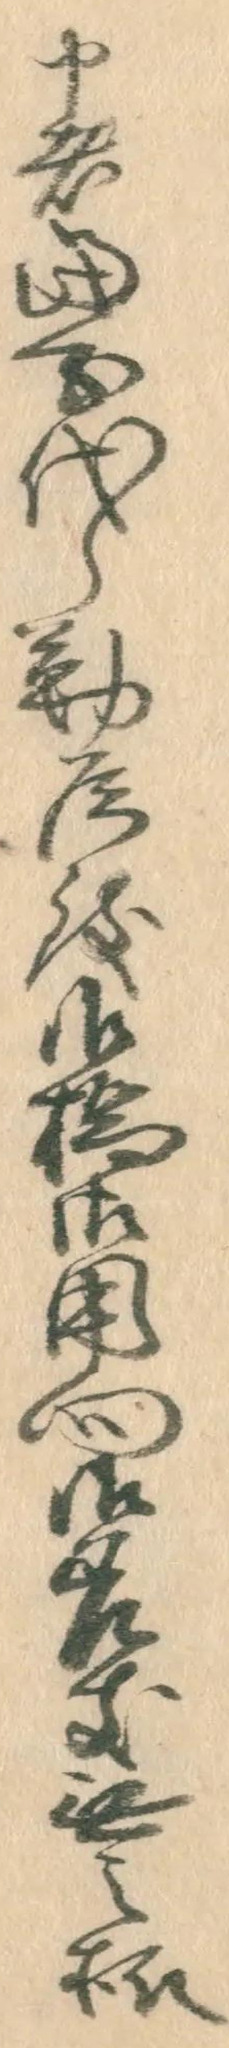申者当分代り勤為致御橋御用向御差支無之様
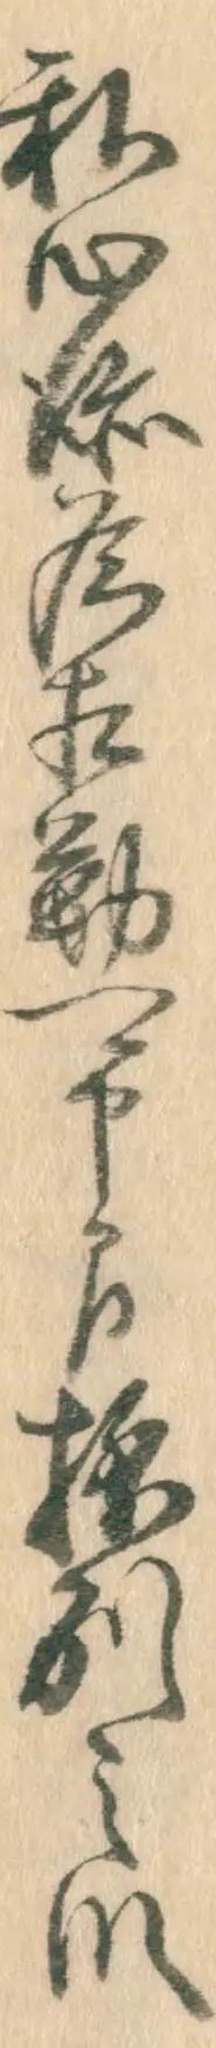私心添為相勤可申間格別之以
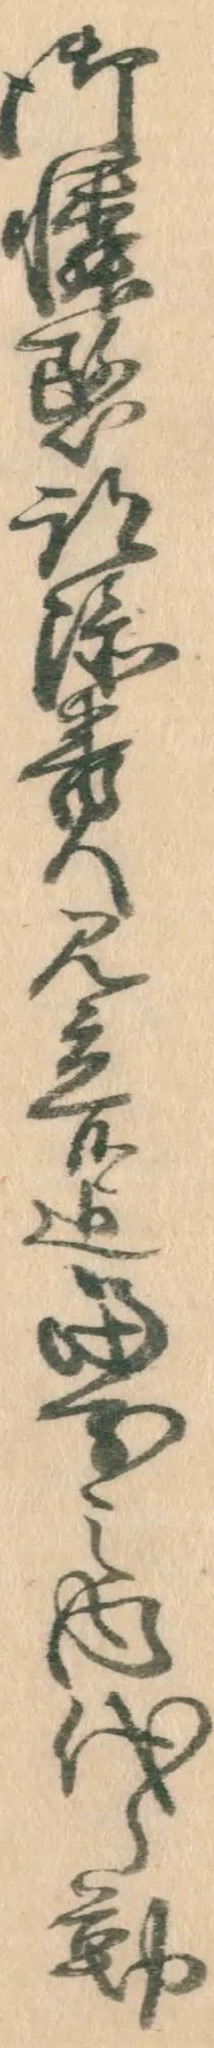御憐愍跡添番人見立候迄当分之内代り勤
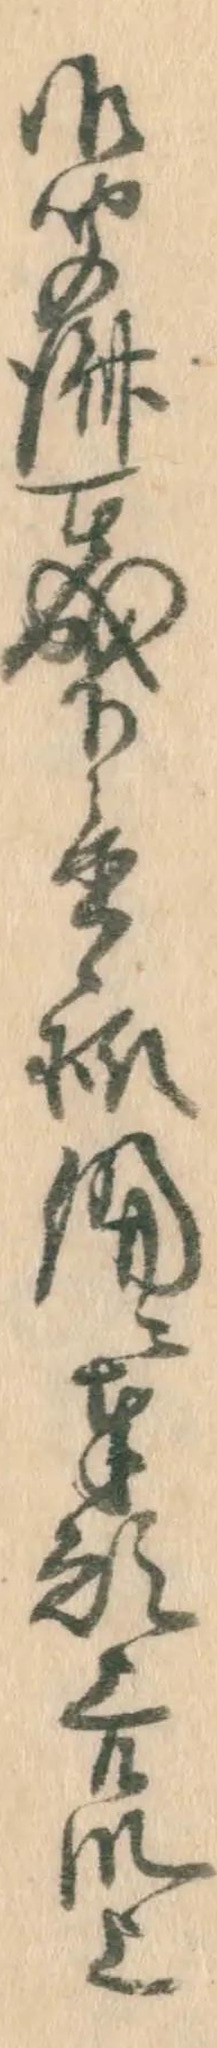御聞済被成下置候様偏ニ奉願上候以上
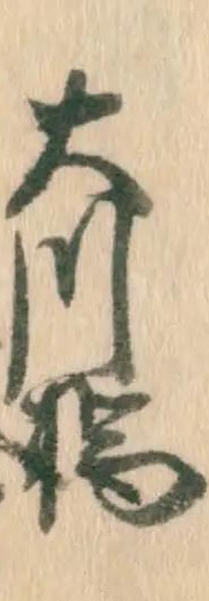大川橋
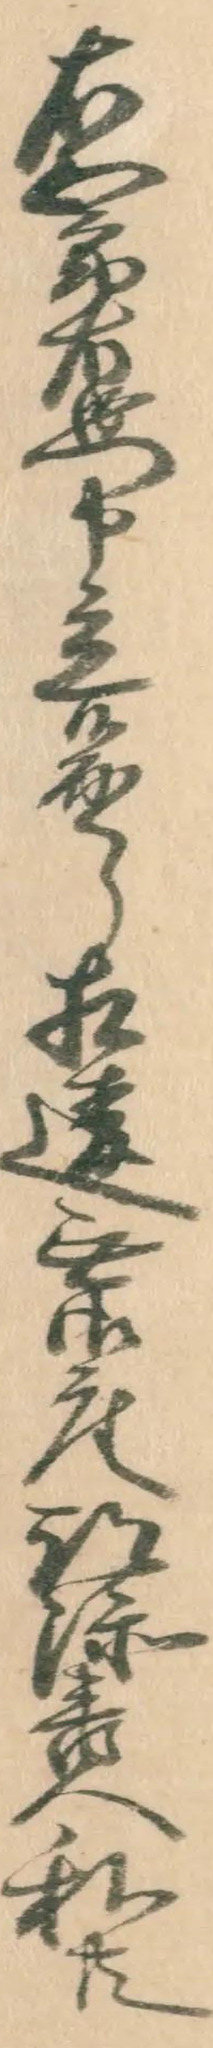右五郎右衛門申立候通り相違無御座跡添番人私共
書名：三橋 17巻. [8] 三橋小破御修復書留　但御奉行御掛リ替地震潰橋番屋　嘉永四亥年より安政二卯年迄　下
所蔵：国立国会図書館 National Diet Library, JAPAN
